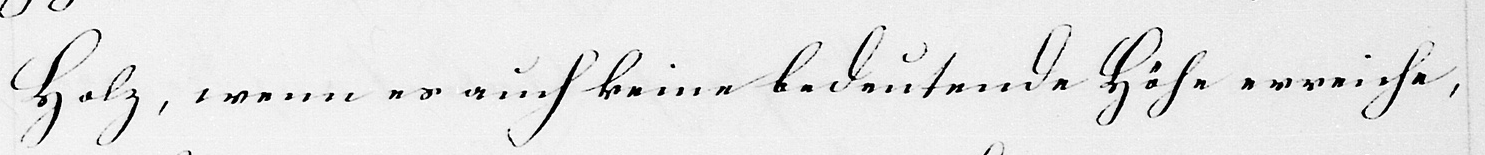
Holz, wenn es auch keine bedeutende Höhe erreiche,
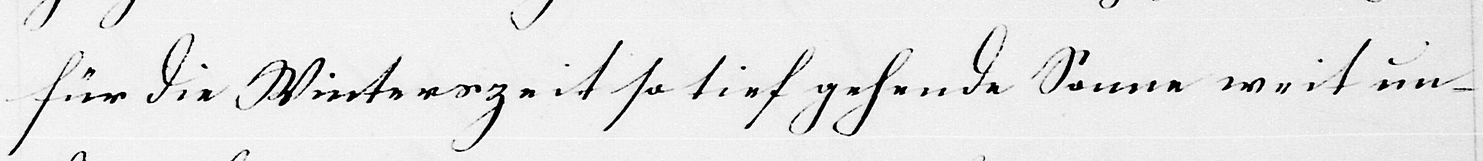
für die Winterszeit so tief gehende Sonne weit un¬
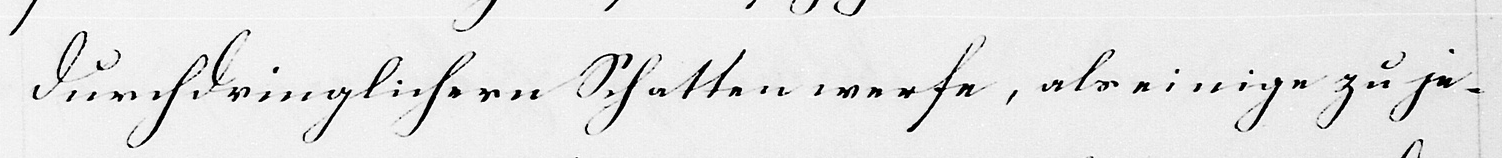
durchdringlichern Schatten werfe, als einige zu je¬
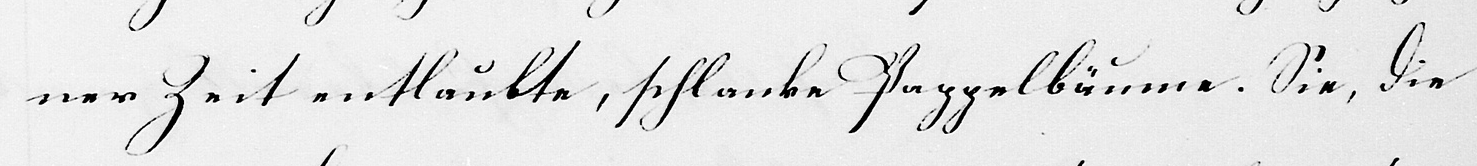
ner Zeit entlaubte, schlanke Pappelbäume. Sie, die
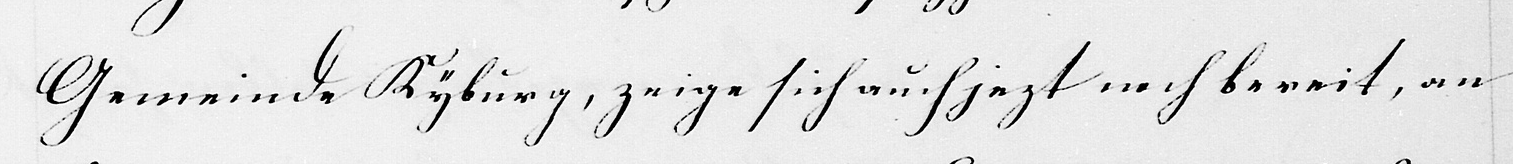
Gemeinde Kyburg, zeige sich auch jezt noch bereit, an
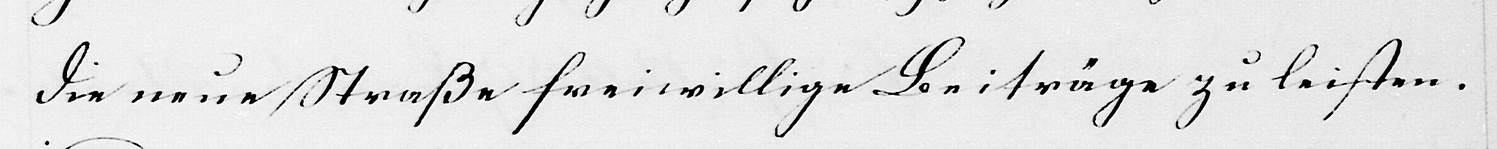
die neue Straße freiwillige Beiträge zu leisten.
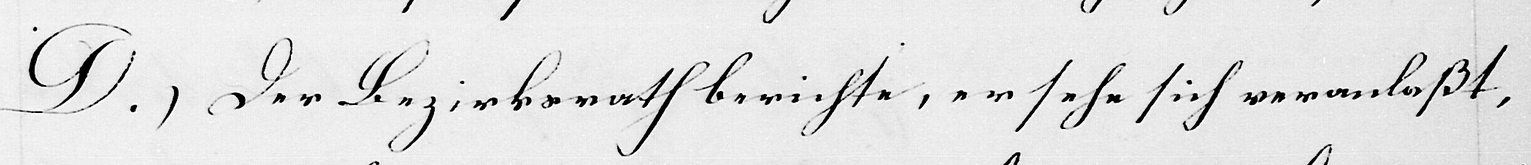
D.) Der Bezirksrath berichte, er sehe sich veranlaßt,
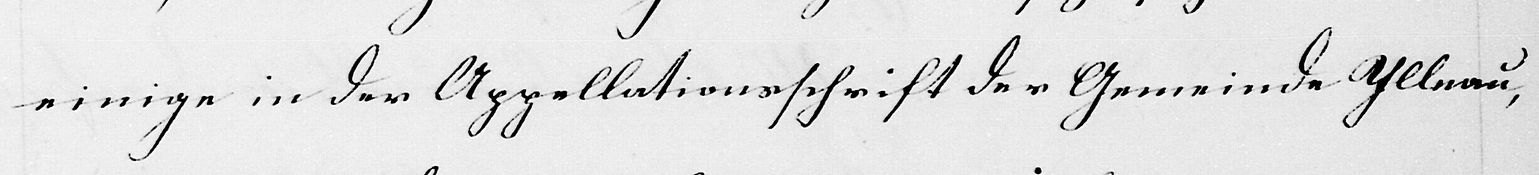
einige in der Appellationsschrift der Gemeinde Illnau,
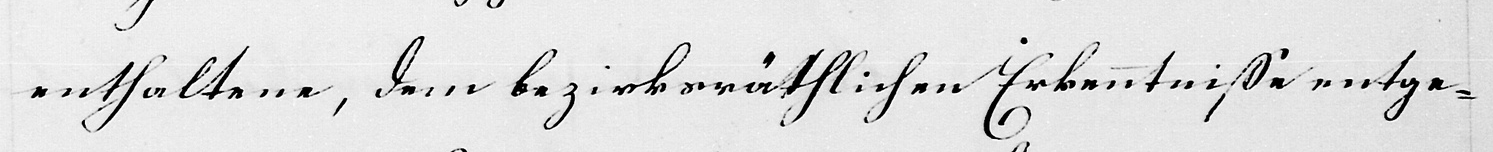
enthaltene, dem bezirksräthlichen Erkenntniße entge¬
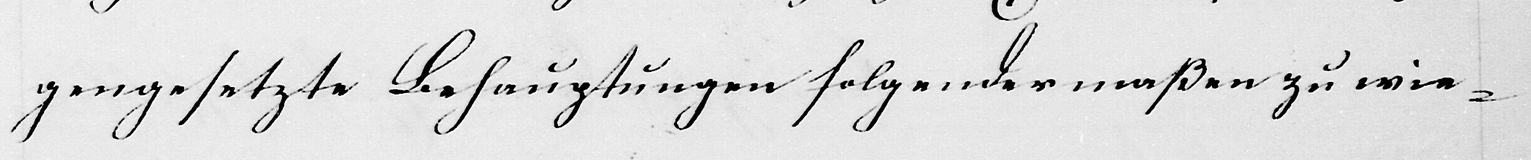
gengesetzte Behauptungen folgendermaßen zu wie¬
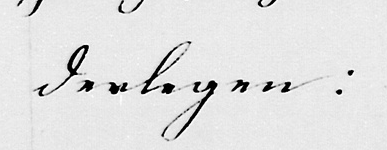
derlegen:
